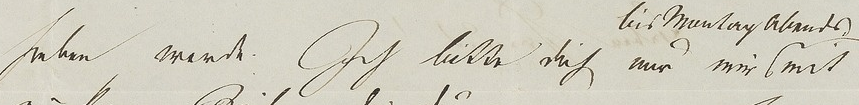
haben werde. Ich bitte Dich nur mir bis
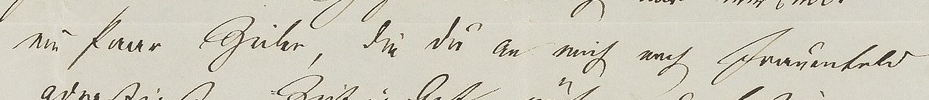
ein Paar Zeilen, die Du an mich nach Frauenfeld
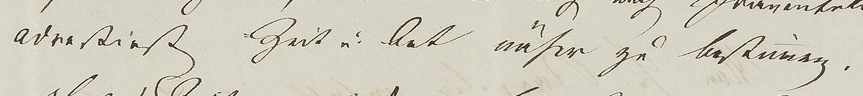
adressirst, Zeit u. Ort näher zu bestimmen.
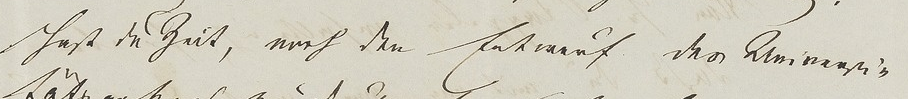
Hast du Zeit, noch den Entwurf des Universi-
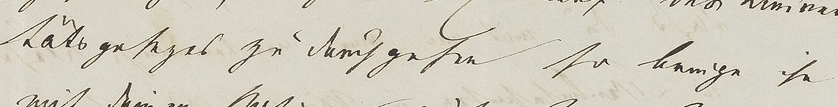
tätsgesetzes zu durchgehen so bringe ihn
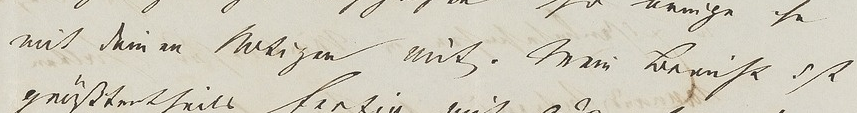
mit deinen Notizen mit. Mein Bericht ist
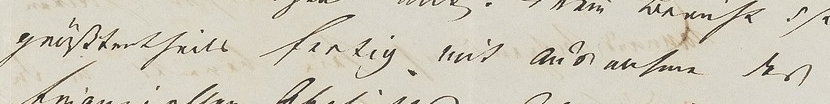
größtentheils fertig mit Ausnahme des
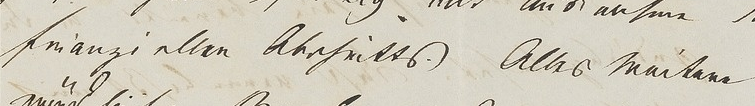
finanziellen Abschnitts. Alles Weitere
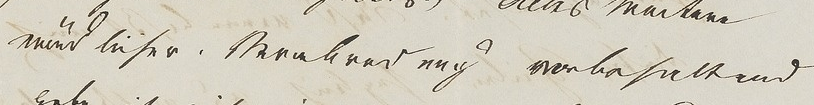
mündlicher Verabredung vorbehaltend
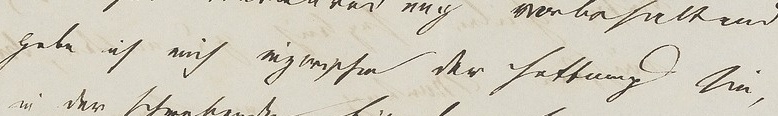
gebe ich mich inzwischen der Hoffnung hin,
